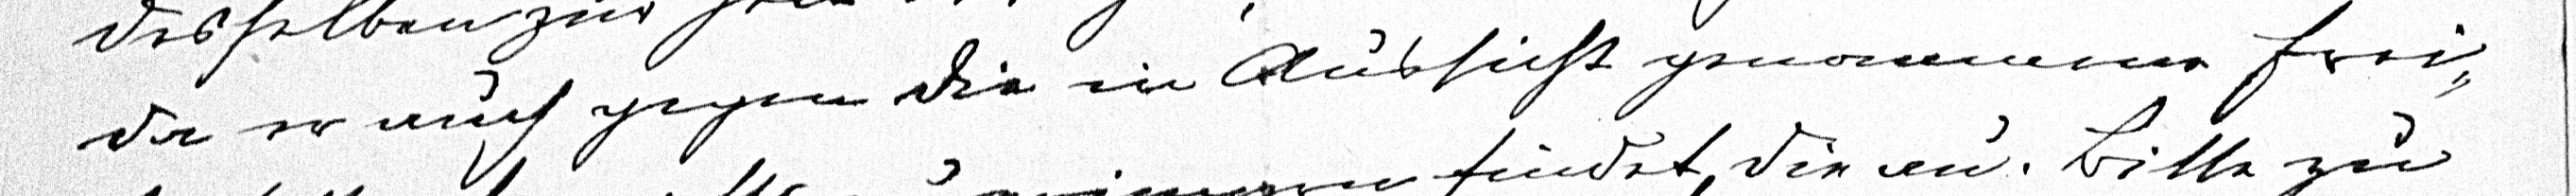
da er auch gegen die in Aussicht genommene Frei¬
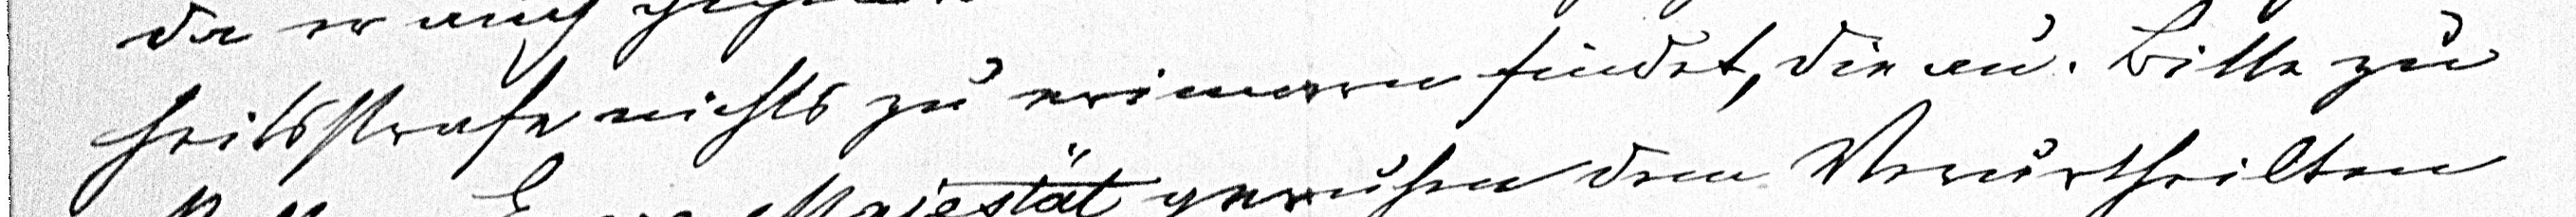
heitsstrafe nichts zu xx findet, die au. Bitte zu
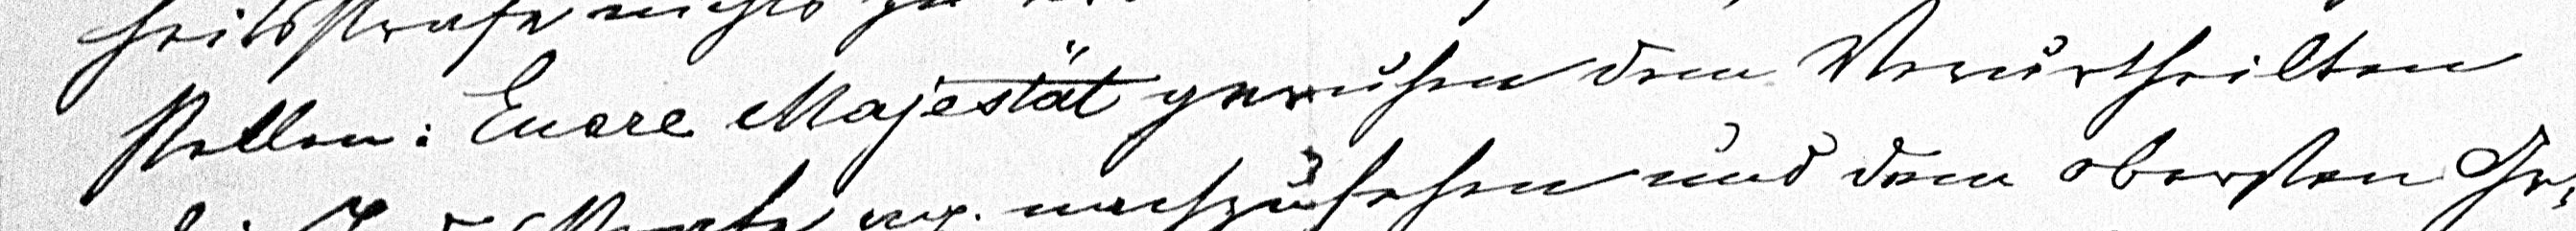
stellen: Euere Majestät geruhen dem Verurtheilten
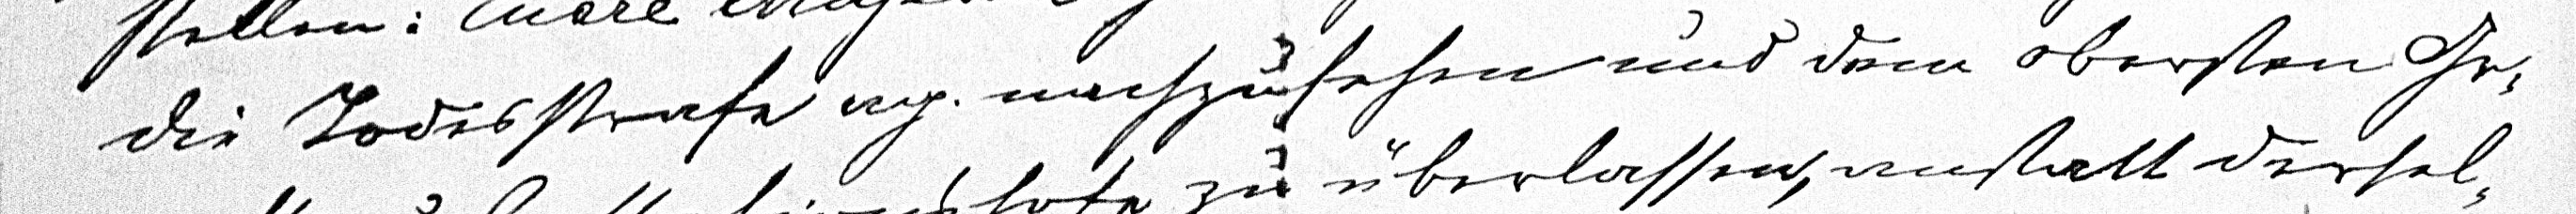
die Todesstrafe ag. nachzusehen und dem obersten Ge¬
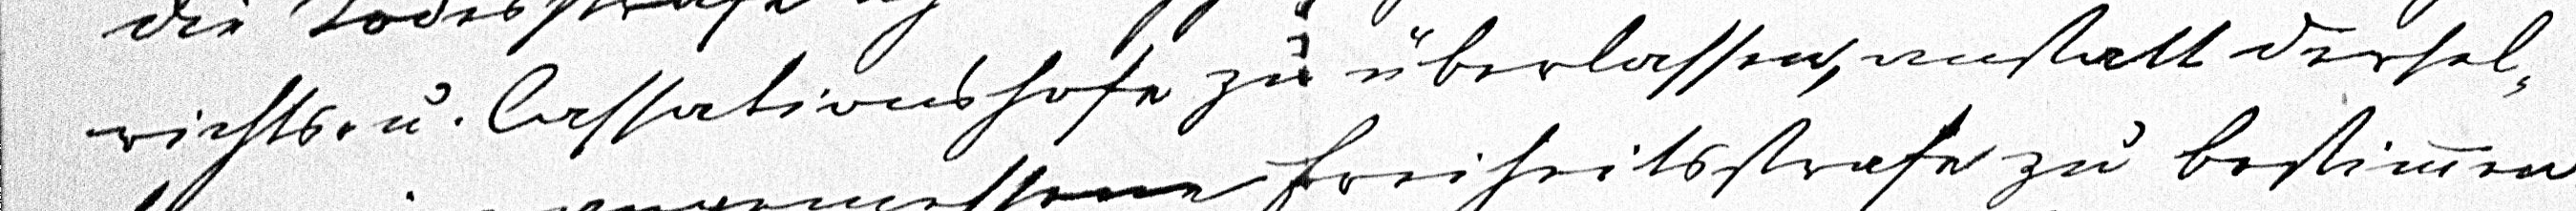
richts- u. Cassationshofe zu überlassen, anstatt dersel¬
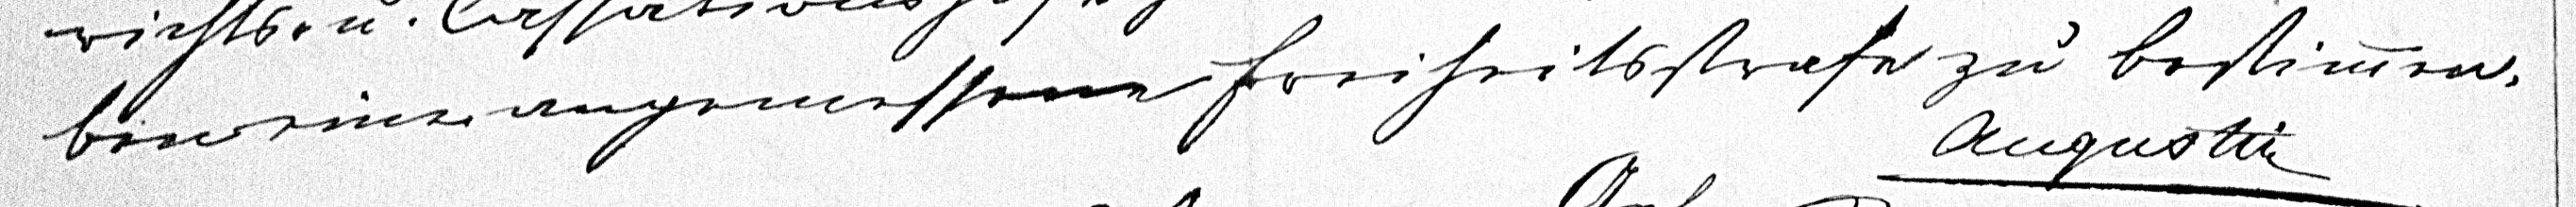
ben eine angemessene Freiheitsstrafe zu bestimmen.
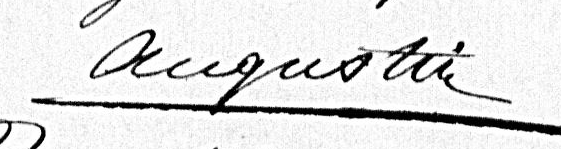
Augustin
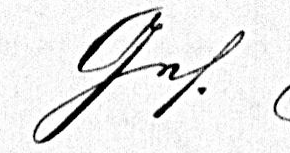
Ges.
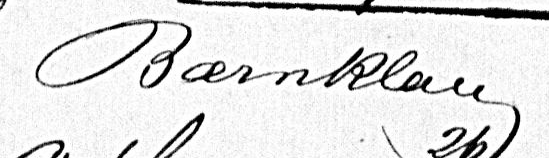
Barnklau
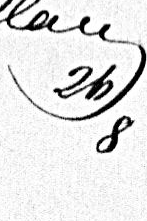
26/8
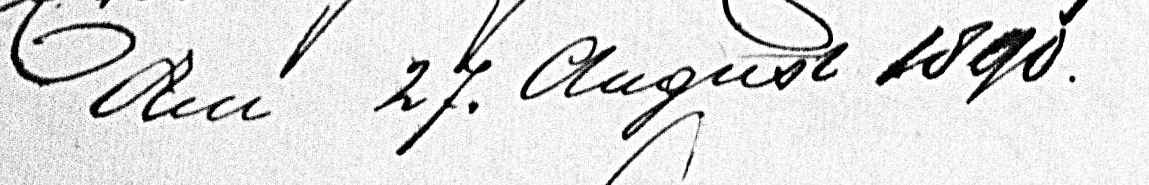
Am 27. August 1890.
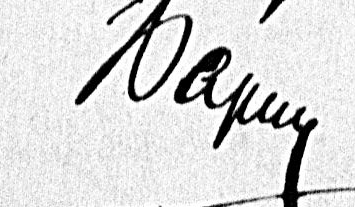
xx
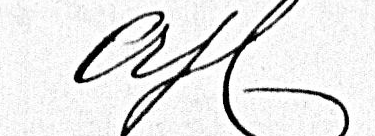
AhE
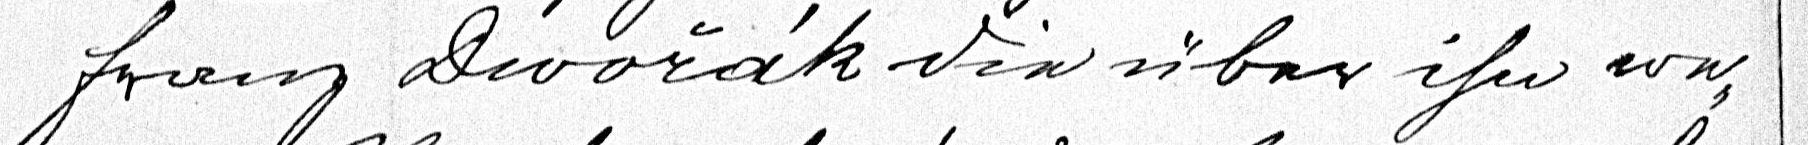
Franz Dwořác die über ihn we¬
